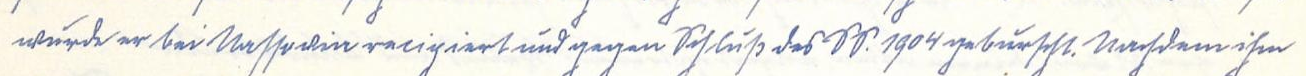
wurde er bei Nassowia recipiert gegen Schluß des SS 1904 geburscht. Nachdem ihn
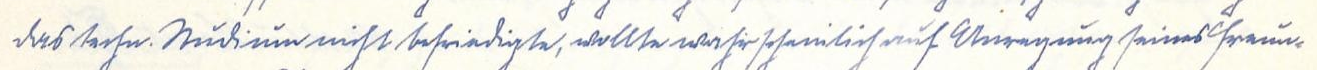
das technische Studium nicht befriedigte, wollte wahrscheinlich auf Anregung seines Freun-
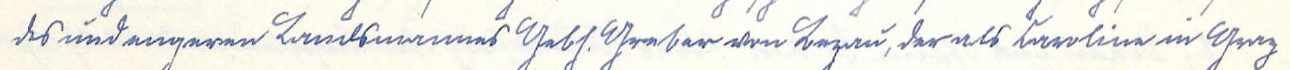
des und engeren Landsmanns Gebh. Greber von Bezau, der als Caroline in Graz
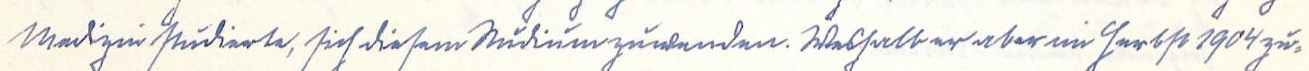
Medizin studierte, sich diesen Studium zuwenden. Weshalb er aber im Herbst 1904 zu-
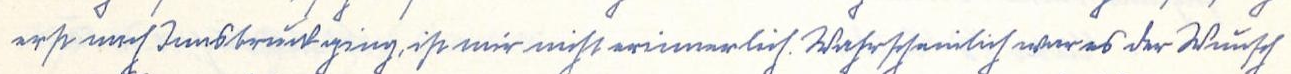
erst nach Innsbruck ging, ist mir nicht erinnerlich. Wahrscheinlich war es der Wunsch
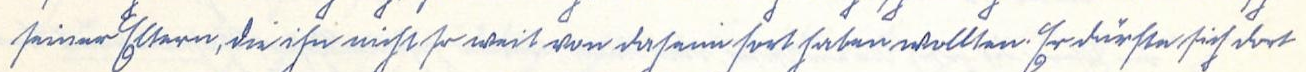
seiner Eltern, die ihn nicht so weit von daheim fort haben wollen. Er dürfte sich dort
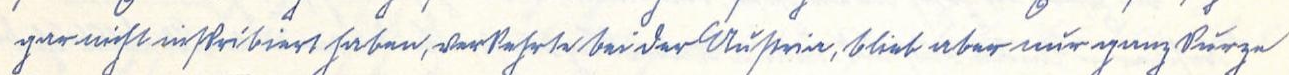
gar nicht inskribiert haben, verkehrte bei der Austria, blieb aber nur ganz kurze Zeit dort.
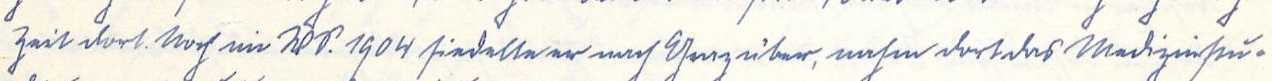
Noch im WS. 1904 siedelte er nach Graz über, nahm dort das Medizinstu-
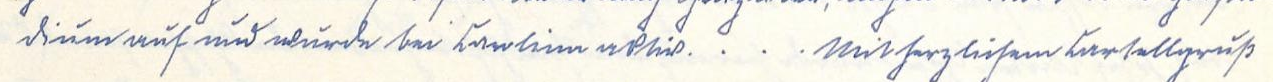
dium auf und wurde bei Carolina aktiv… Mit herzlichem Cartellgruß
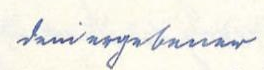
dein ergebener
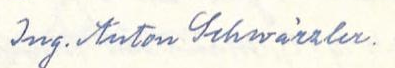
Ing. Anton Schwärzler.
